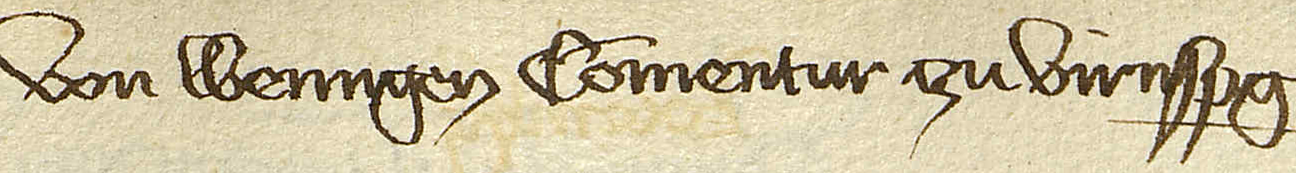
von w%%ngen Co*mentur cʒu virnſp*g
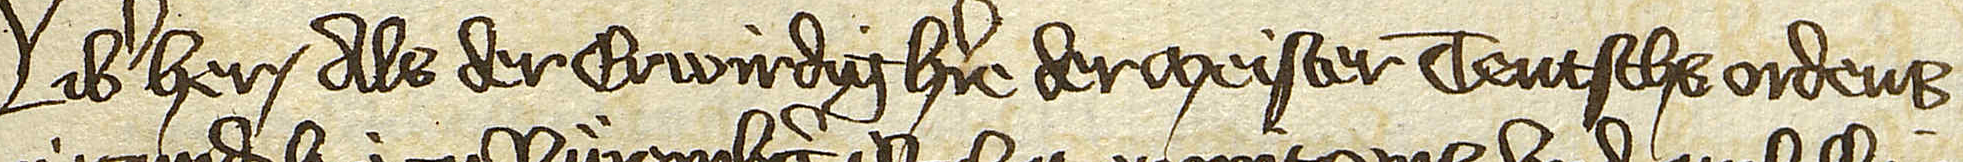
Lib* her / Als der Erwirdig h*re der Meiſter Teutſchs ordens
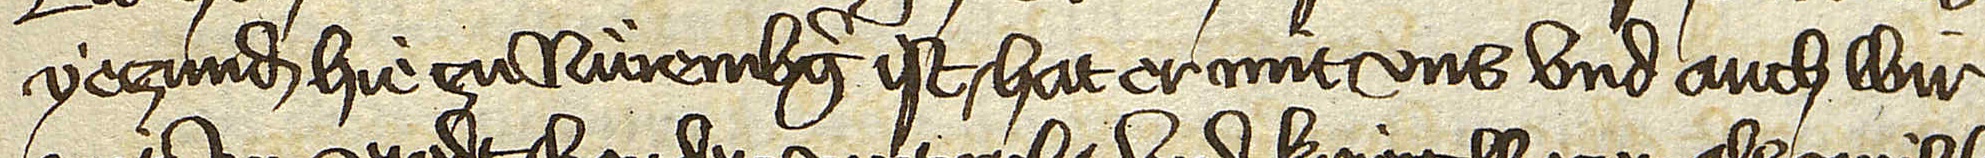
yecʒund* hie cʒu Nüremb*g iſt / hat er mit vns vnd auch wir
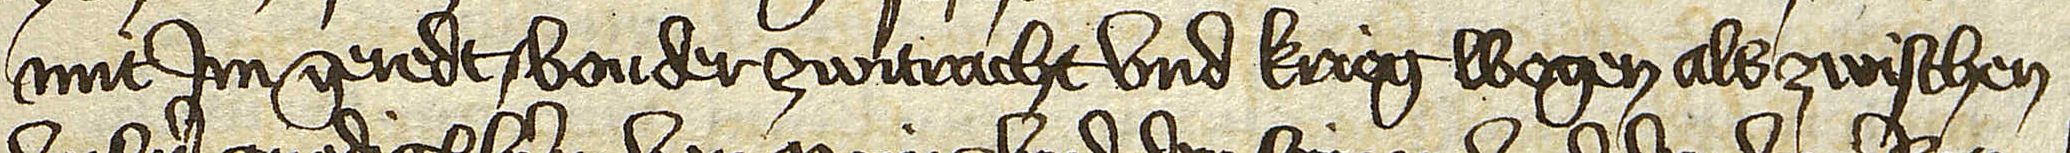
mit Im geredt / von der cʒwitracht vnd krieg wegen als cʒwiſchen
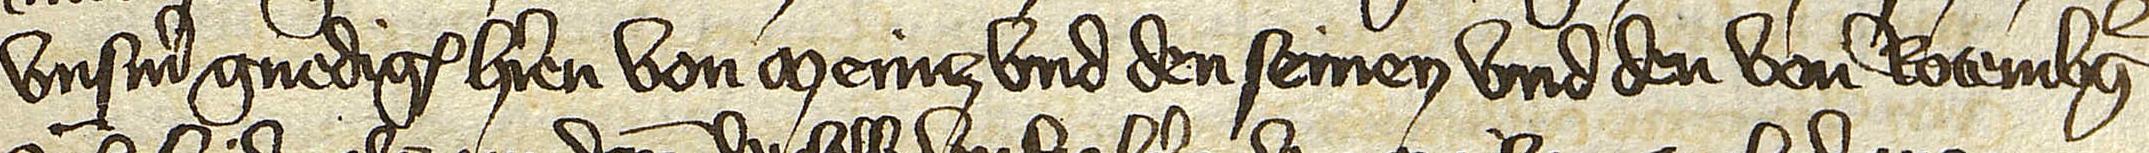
vnſm* gnedig* hr*en von Meincʒ vnd den ſeinen vnd den von Rotemb*g
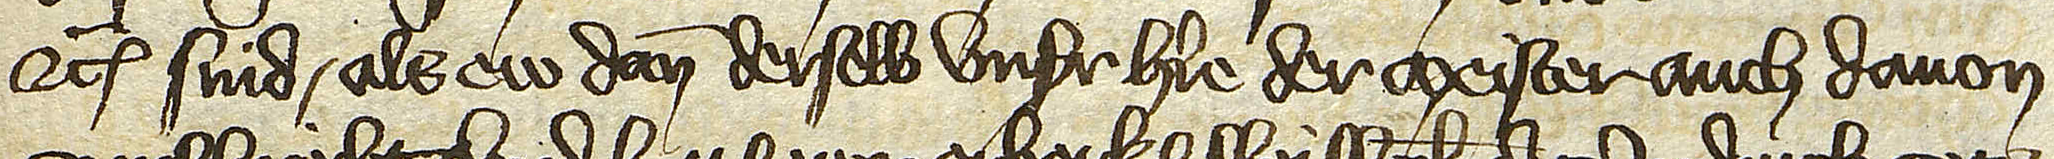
ec* ſind / als ew dan* derſelb vnſ*r h*re der Meiſter auch dauon
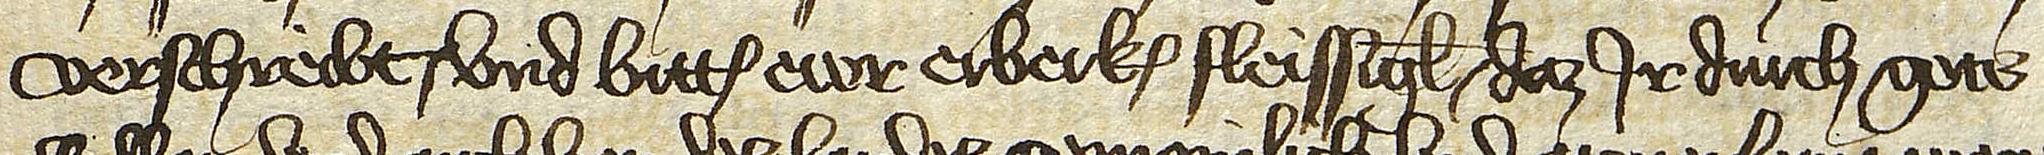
verſchreibt / vnd bitt* ewr erberk* fleiſſigl* / daʒ Ir durch gots
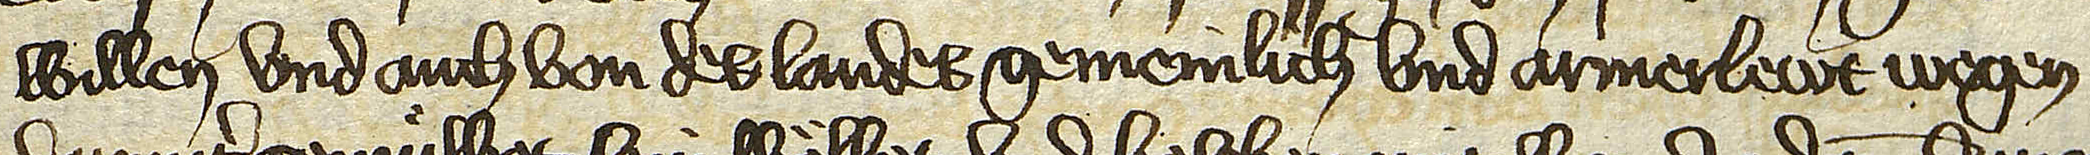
willen vnd auch von des landes gemeinlich vnd armerlewt wegen
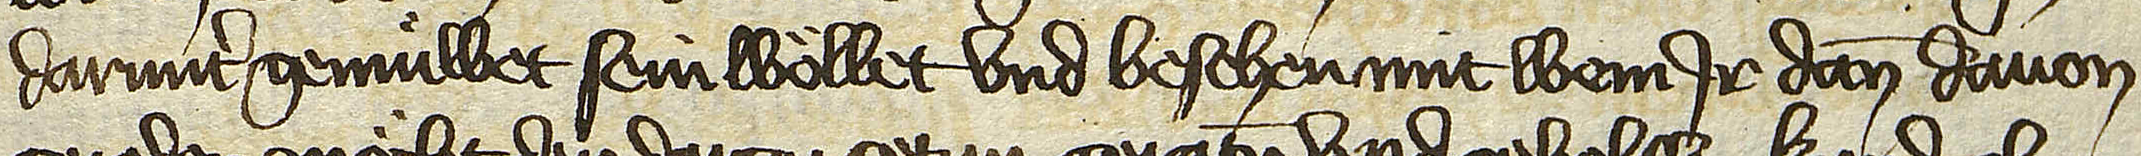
darunt* gemüwet ſein wöllet vnd beſehen mit wem Ir dan* dauon
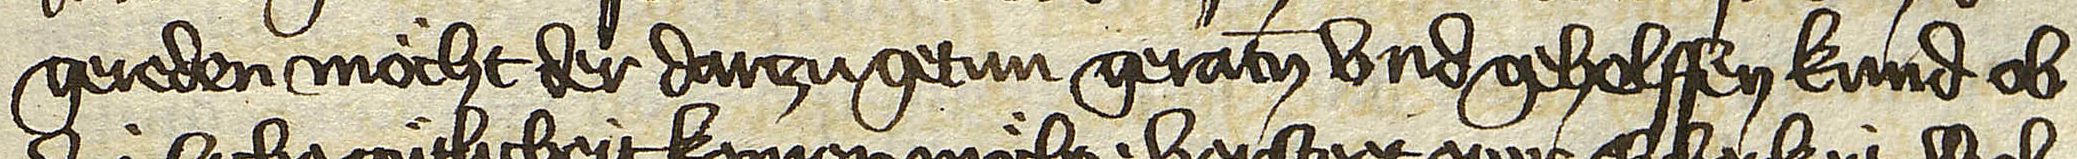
gereden möcht der darcʒu getun geratn* vnd geholffen kund ob
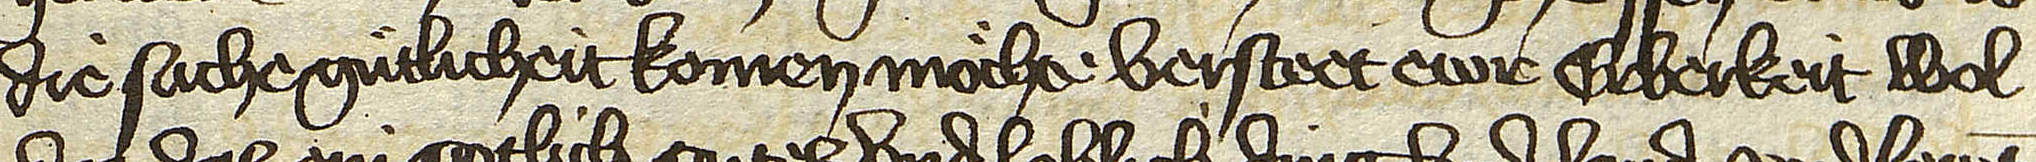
die ſache güthlicheit komen möchte verſteet ewr Erberkeit wol
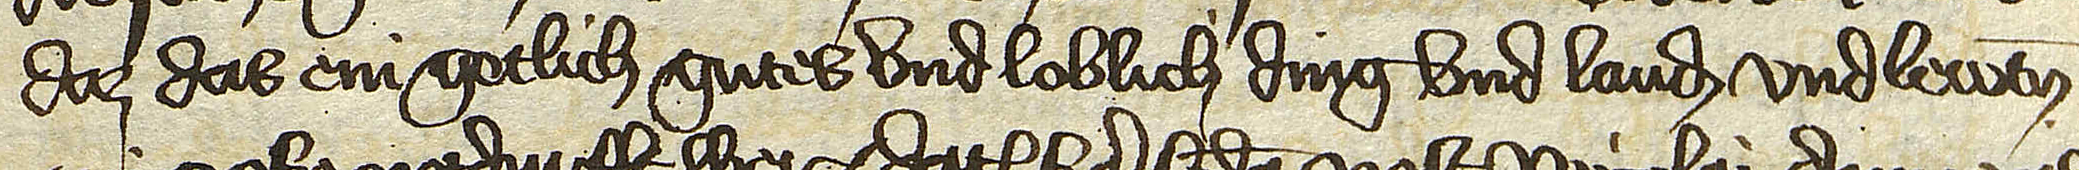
daʒ das ein gotlich gutes vnd loblich ding vnd land* vnd lewtn*
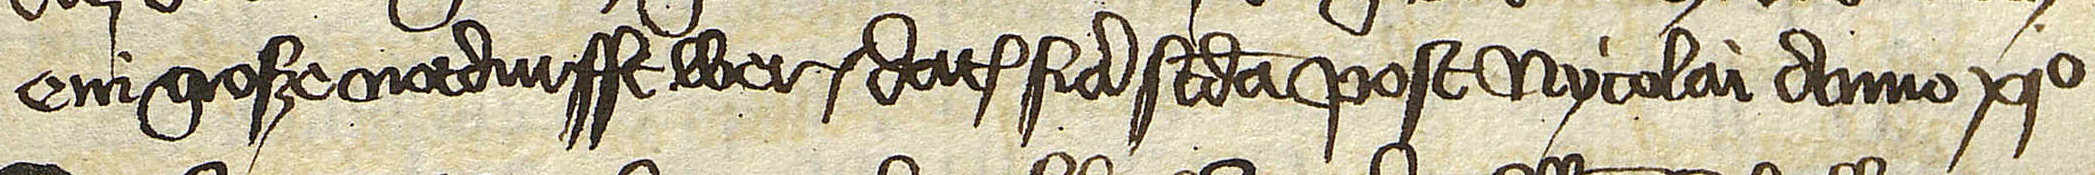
ein groſʒe notdurfft wer / dat* fia* ſcda* poſt Nycolai Anno xi*
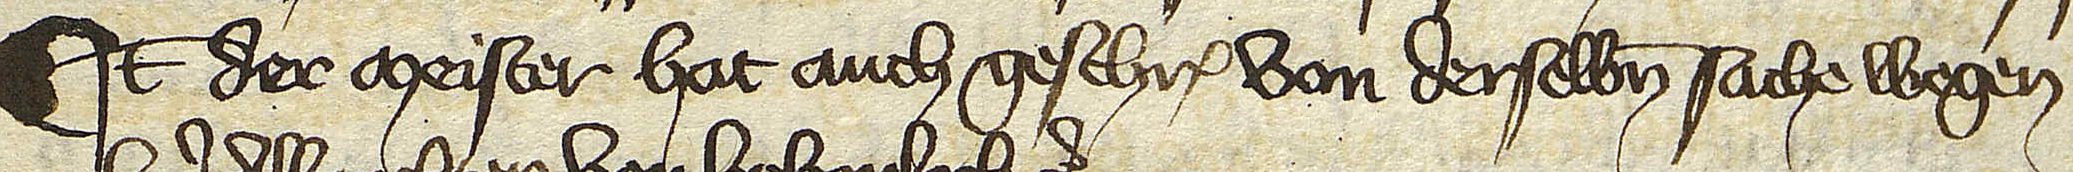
It der Meiſter hat auch geſchr* von derſelbn* ſache wegen
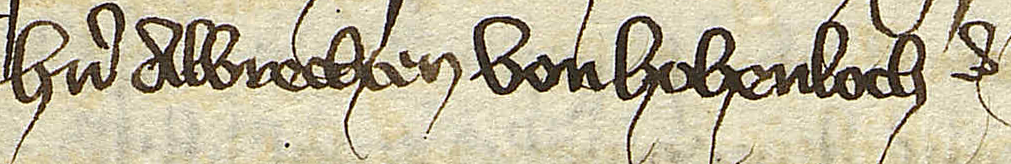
hn* Albrechten von hohenloch §
